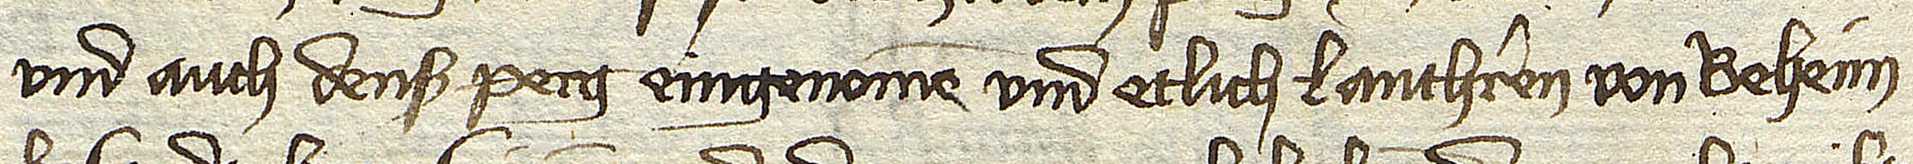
vnd auch denſ* Perg eingenome* vnd etlich lanth*ren von Beheim
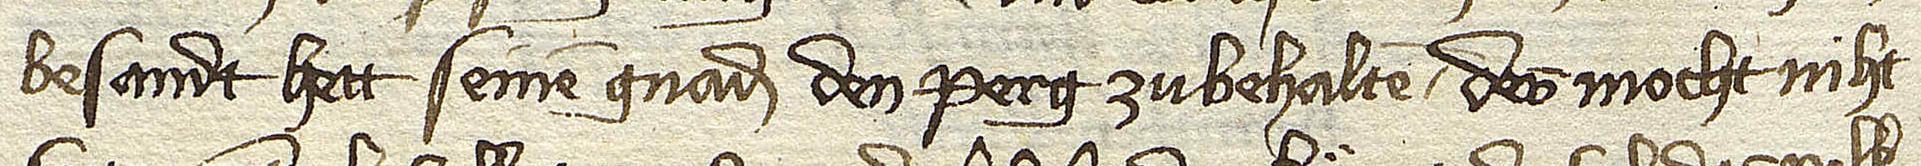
beſandt hett ſeine* gnad* den Perg ʒu behalte* / Des mocht niht
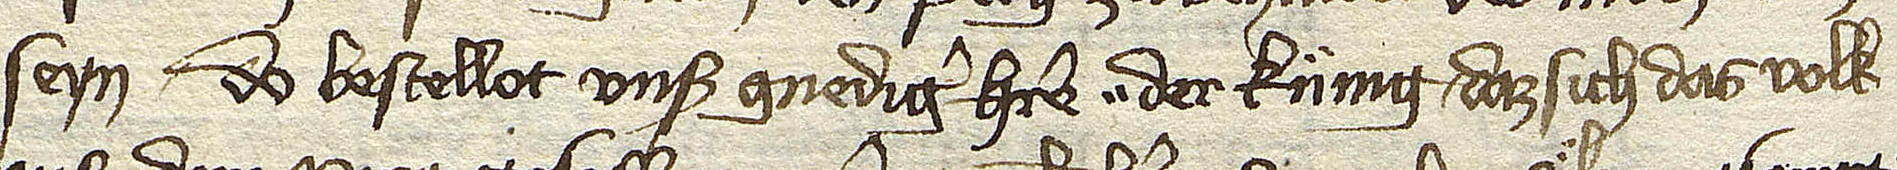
ſeyn / Do beſtellot vnſ* gnedig* h*re ~ der künig / daʒ ſich das volk
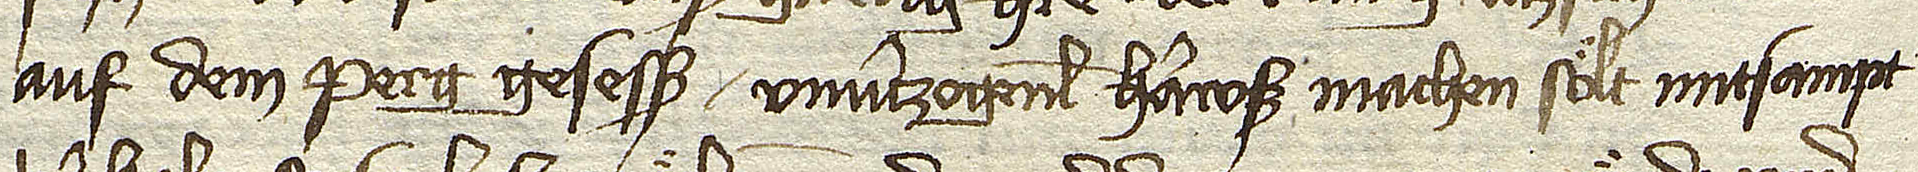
auf dem Perg geſeſſ* / vnu*cʒogenl* h*awſʒ machen ſölt mitſampt
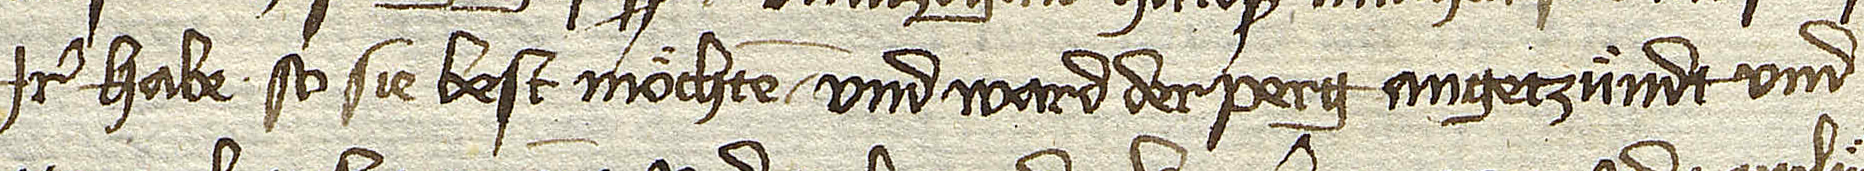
Ir* habe . ſo ſie beſt möchte* / vnd ward der perg angecʒündt vnd
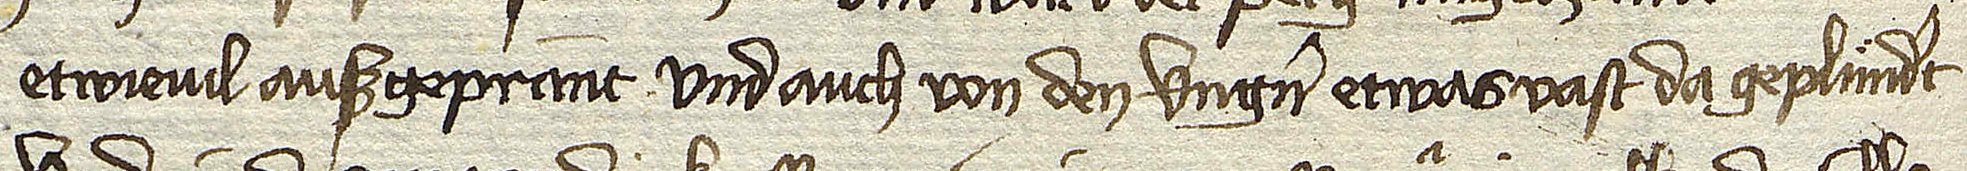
etwieuil auſʒgepran*t . vnd auch von den Vng*n etwas vaſt da geplünd*t
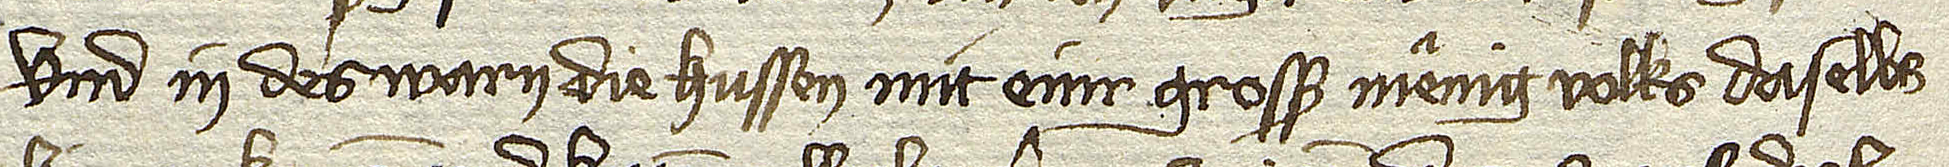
Vnd in des warn die Huſſen mit einr groſſ* mënig volks daſelbs
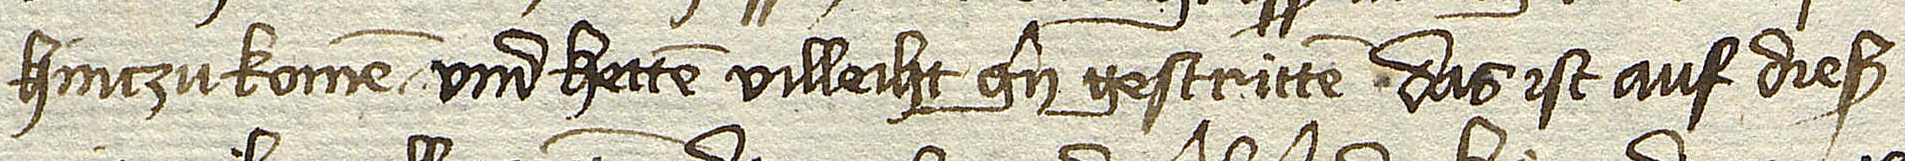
hincʒu kome* / vnd hette* villeiht g*n geſtritte* Das iſt auf dieſ*
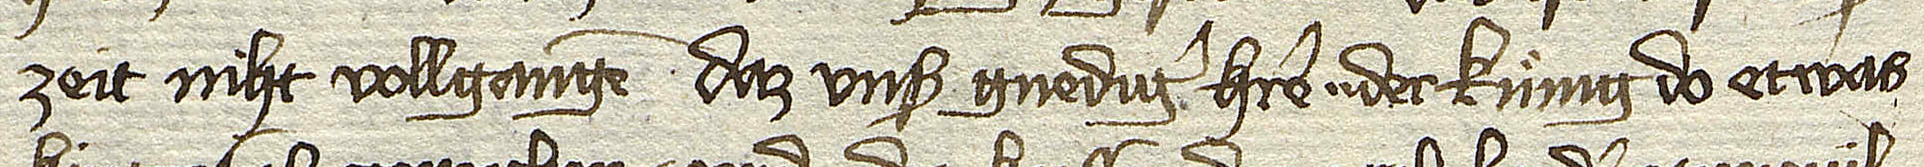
ʒeit niht vollgange* . daʒ vnſ* gnedig* h*re ~ der künig do etwas
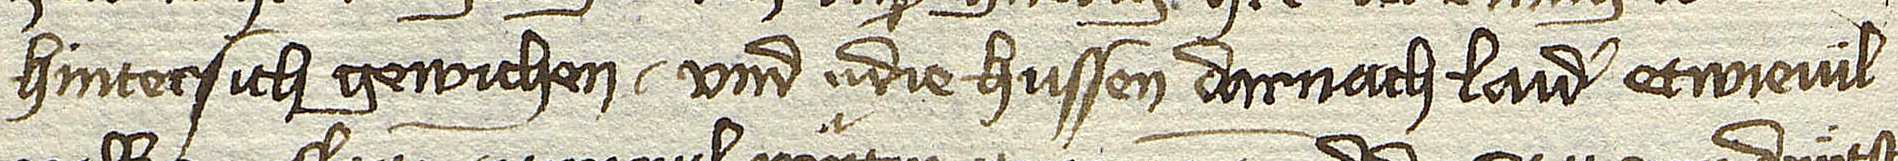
hinter ſich gewichen / vnd ~ die huſſen darnach laid* etwieuil
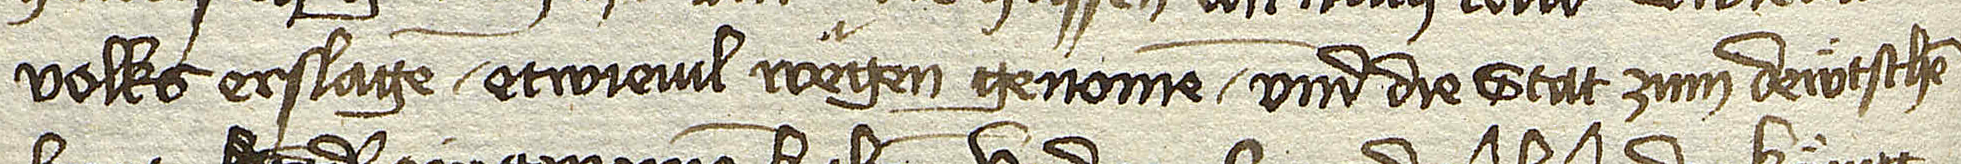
volks erſlage* / etwieuil wëgen genome* / vnd die Stat ʒum dewtſche*
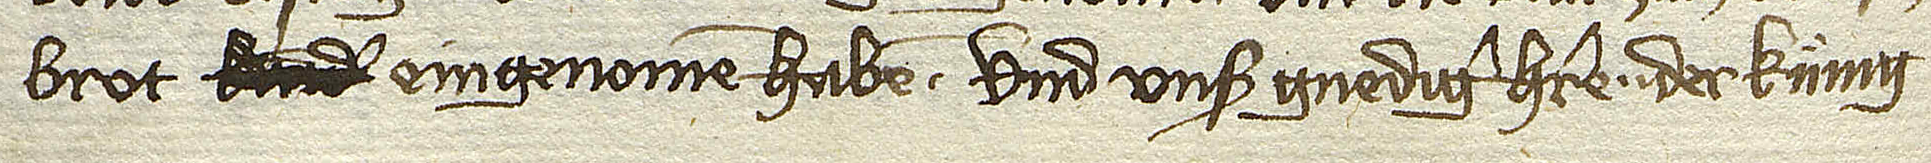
brot laid* eingenome* habe* . Vnd vnſ* gnedig* h*re ~ der künig
